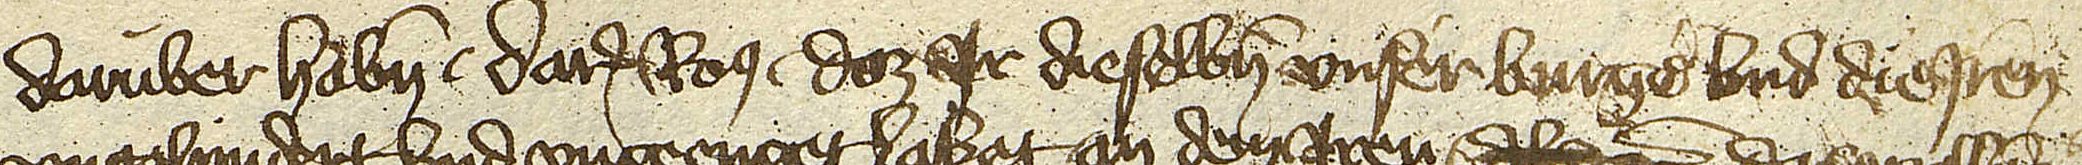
darüber habn* / dar* Ro* / daʒ Ir dieſelbn* vnſer burge* vnd die Iren
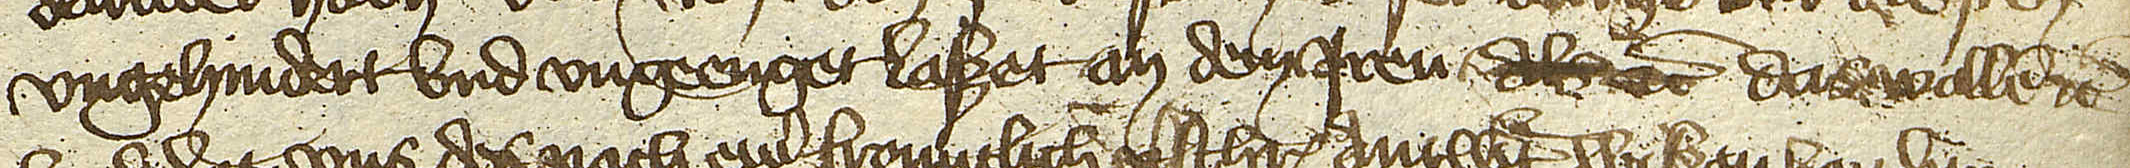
vngehindert vnd vngeenget laſʒet an dem Iren / Als ec* das wolle* ec*
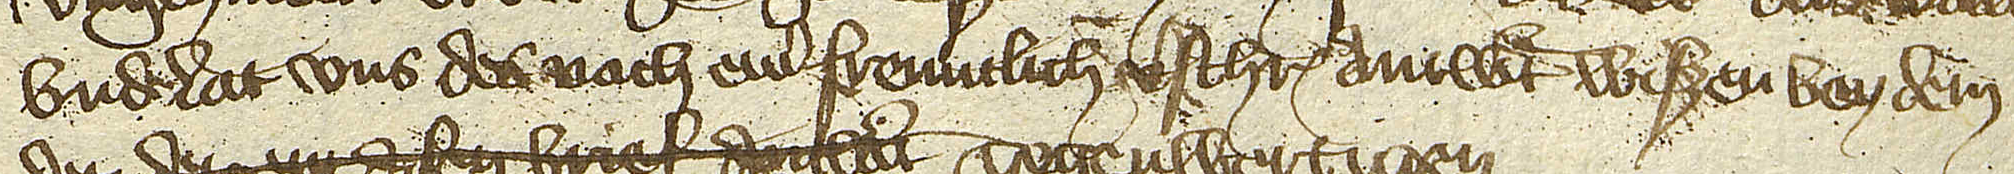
vnd lat vns des nach ew* freutnlich v*ſchr* Antwt* wiſʒen bey dem
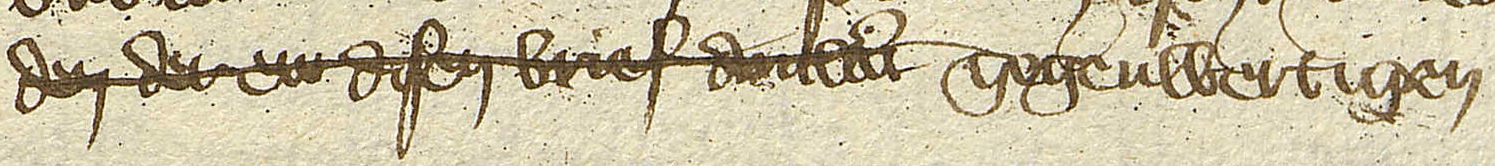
den der ew diſen brief Antwt* gegenwertigen
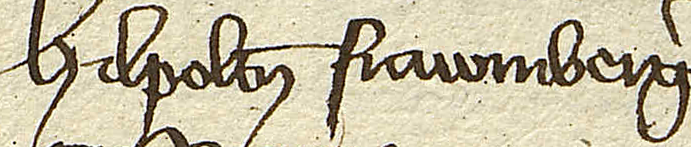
Hilpoltn* frawmberg*
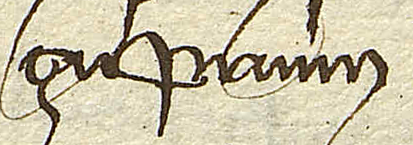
cʒu Prunn
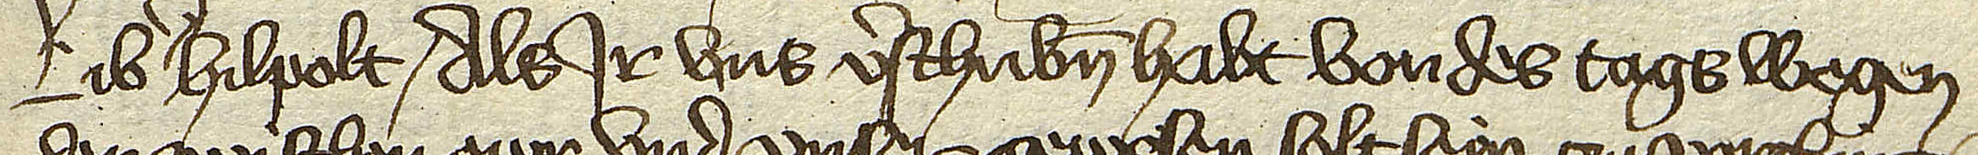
Lib* hilpolt / Als Ir vns v*ſchribn* habt von des tags wegen
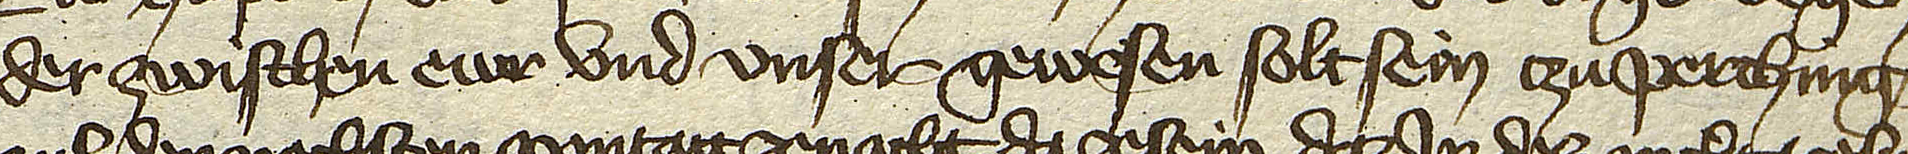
der cʒwiſchen ewr vnd vnſer geweſen ſolt ſein cʒu Perching*
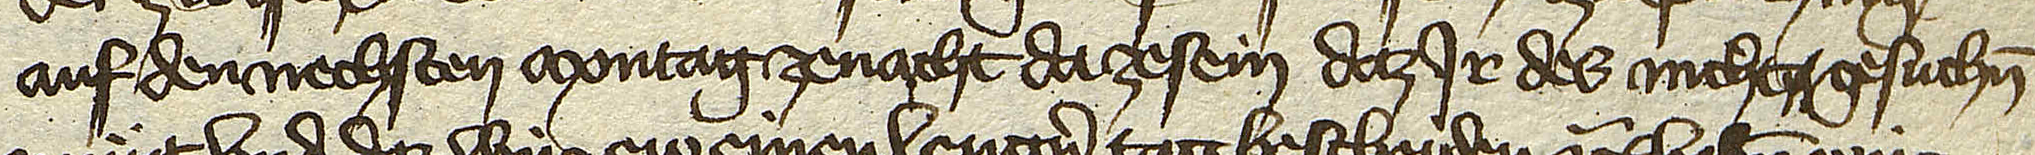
auf den nechſten Montag cʒenacht dacʒeſein daʒ Ir des nicht geſuchn*
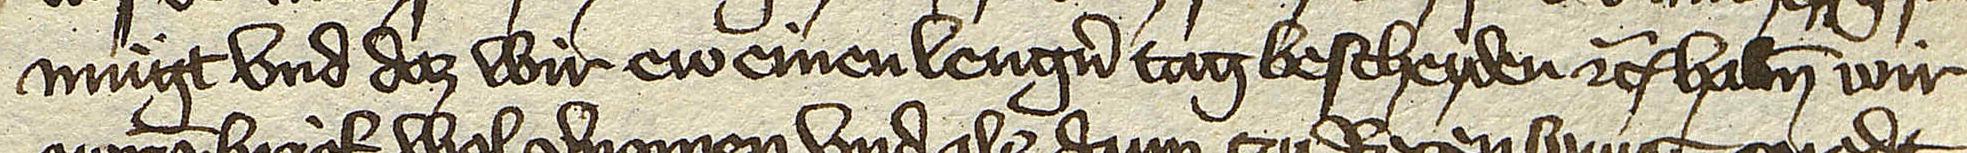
mügt vnd daʒ wir ew einen lengn* tag beſcheyden ec* habn* wir
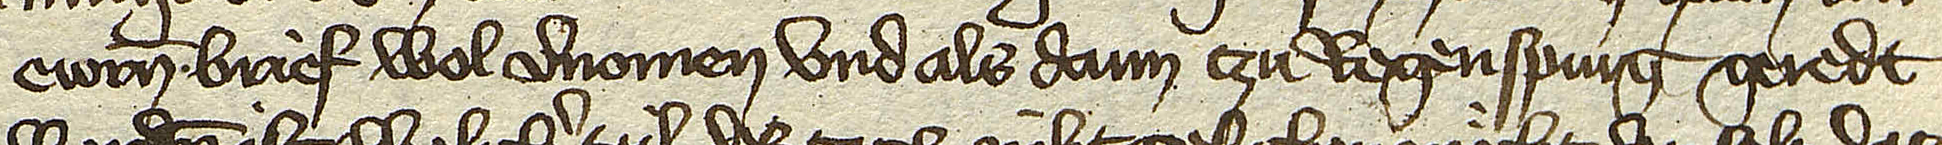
ewrn* brief wol v*nomen vnd als dann cʒu Regenſpurg geredt
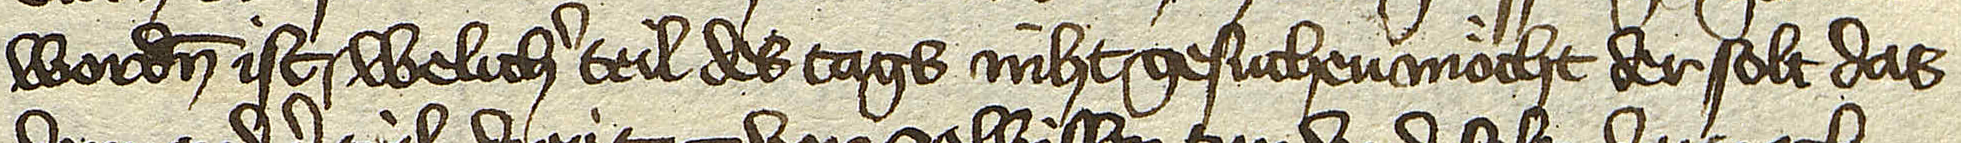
wordn* iſt / welich* teil des tags niht geſuchen möcht der ſolt das
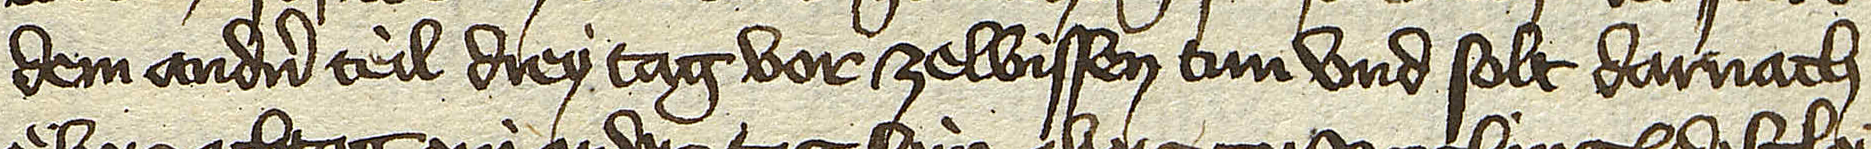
dem andn* teil drey tag vor cʒewiſſen tun vnd ſolt darnach
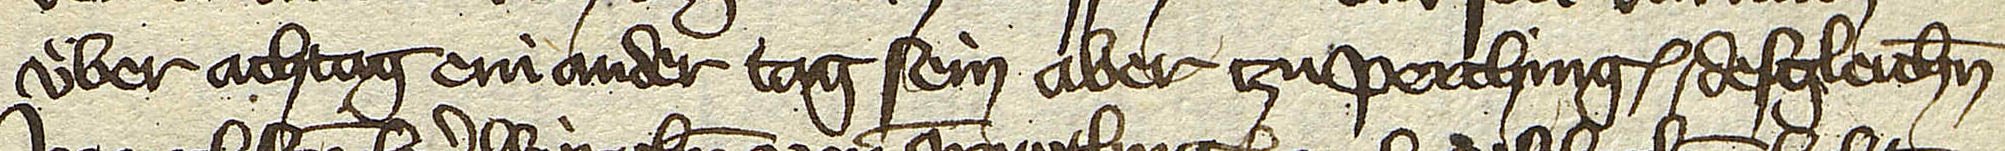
v̈ber achtag ein ander tag ſein aber cʒu Perching* deſgleichn*
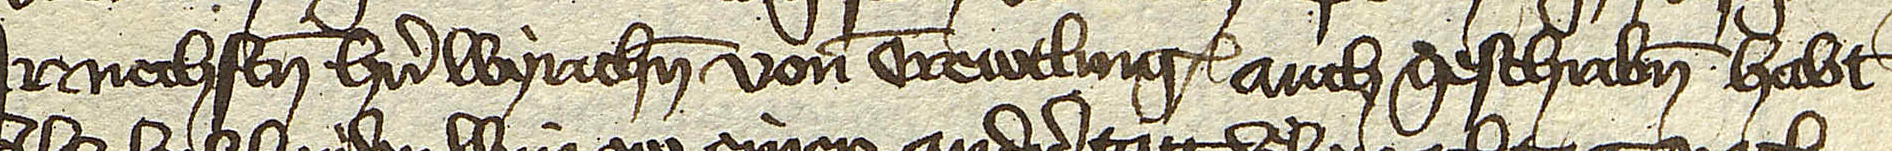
Ir nechſtn* hn* wyrichn* von Trewtling* auch geſchribn* habt
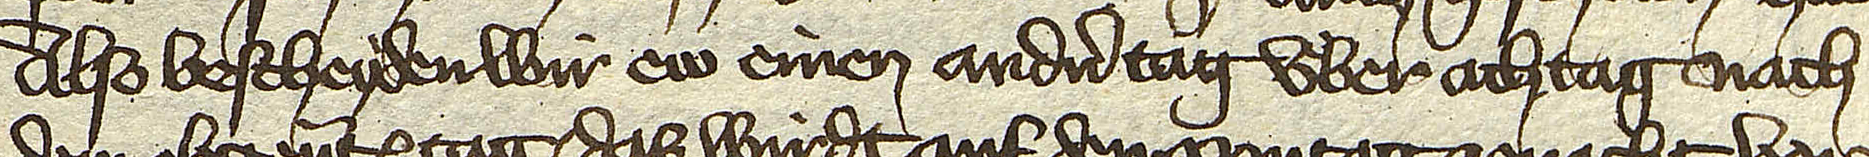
Alſo beſcheyden wir ew einen andn* tag v̈ber achtag nach
